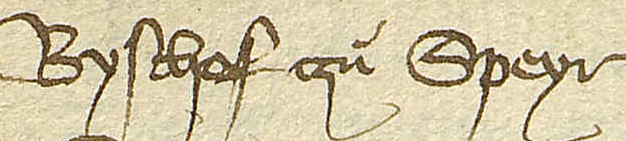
Byſchof cʒü Speyr
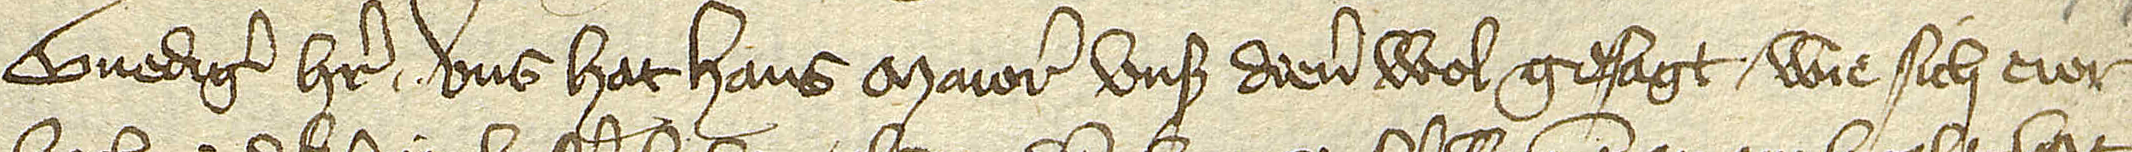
Gnedig* hr* / . Vns hat hans Mawr* vnſ* dien* geſagt / wie ſich ewr
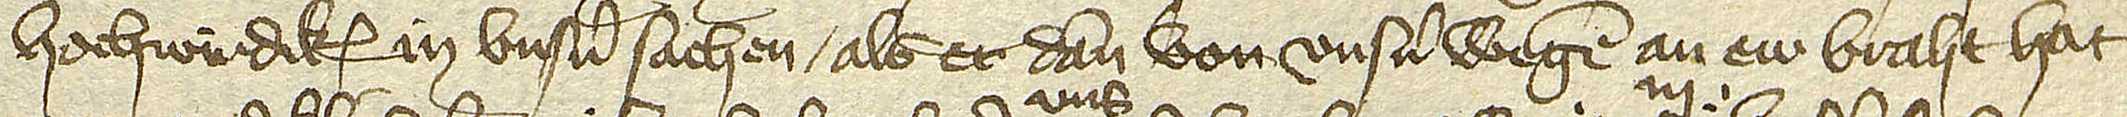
hochwirdik* in vnſn* ſachen / als er dan* von vnſn* wege* an ew braht hat
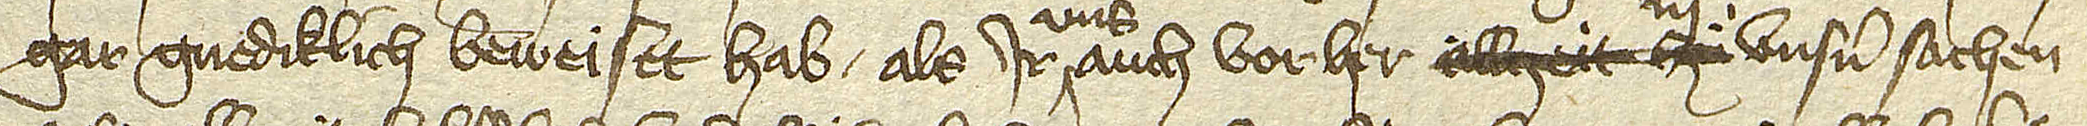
gar gnediklich beweiſet hab / als Ir auch vorher allcʒeit cʒü vnſn* ſachen
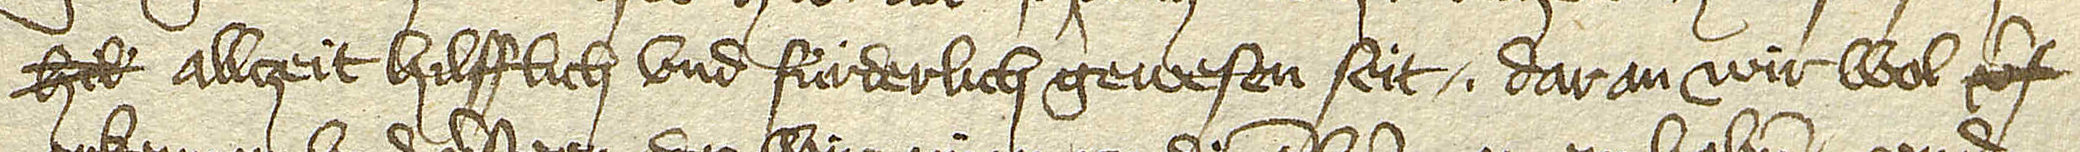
hil allcʒeit hilfflich vnd fürderlich geweſen ſeit / . daran wir wol v*ſ
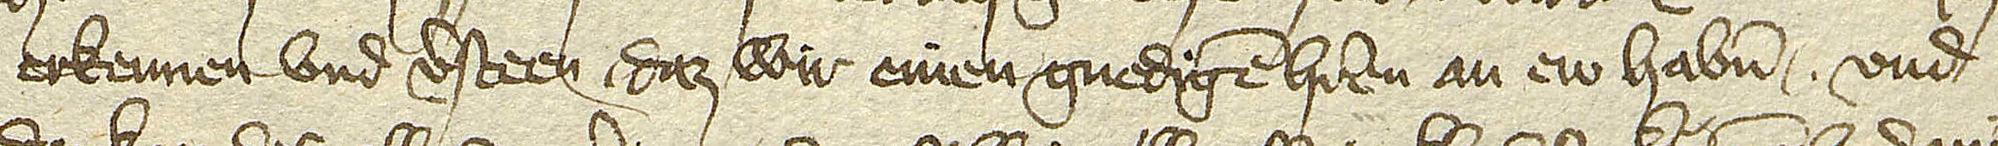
erkennen vnd v*ſteen / daʒ wir einen gnedige* hr*en an ew habn* / . vnd
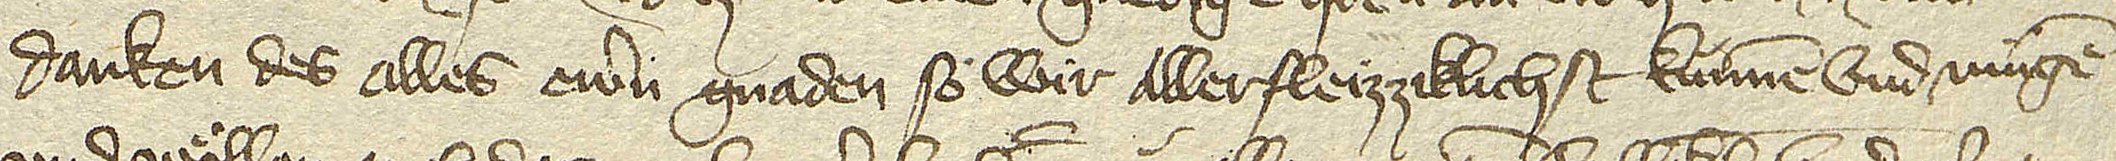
danken des alles ew*n gnaden ſo wir allerfleiʒʒiklichſt künne* vnd müge*
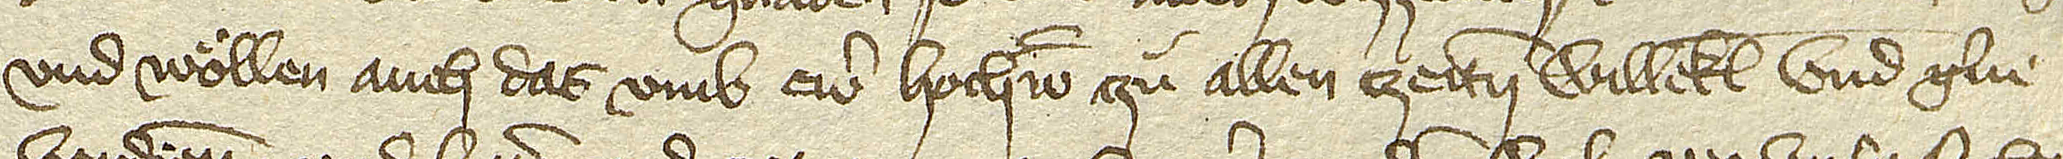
vnd wöllen auch das vmb ew* hochw* cʒü allen cʒeitn* willekl* vnd g*ne
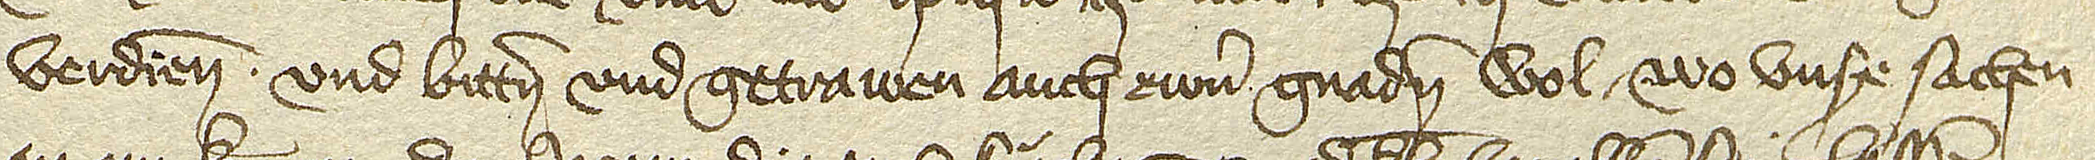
verdien* . vnd bittn* vnd getrawen auch ewn* gnadn* wol / wo vnſ*e ſachen
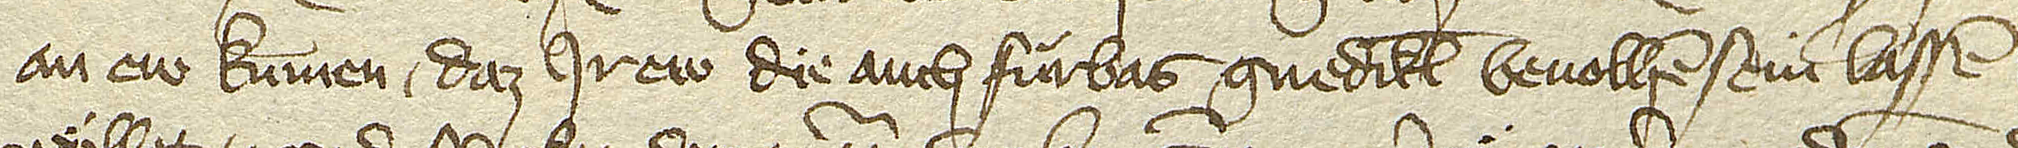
an ew kumen / daʒ Ir ew die auch fürbas gnedikl* beuolhe* ſein laſſe*
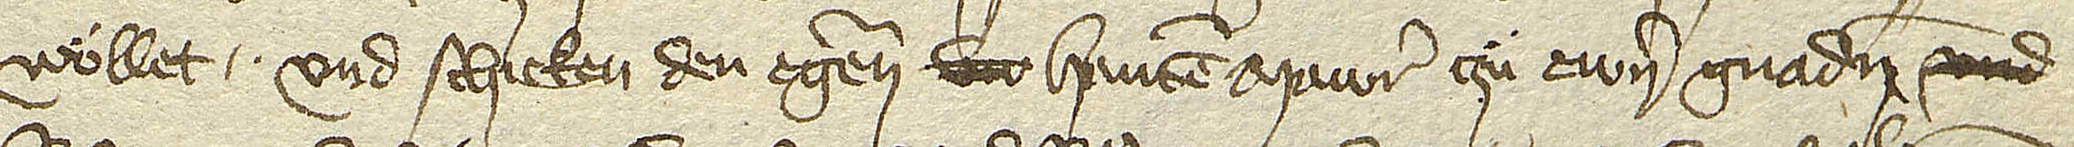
wöllet / . vnd ſchicken den egen* vn hanse* Mawr* cʒü ewn* gnadn* vnd
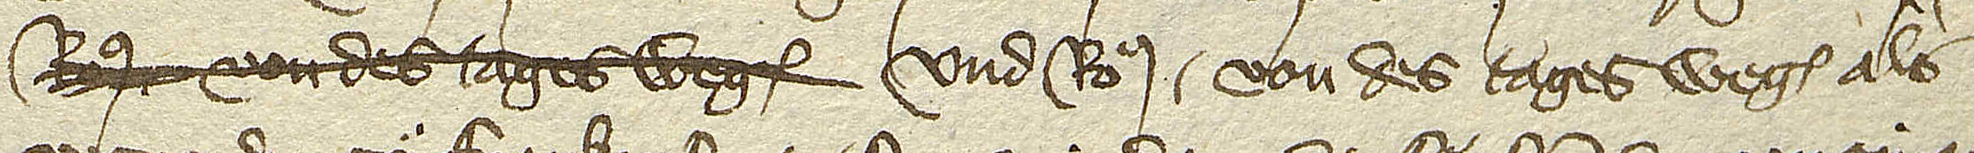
Ro* / von des tages weg* vnd Ro* / von des tages weg* als
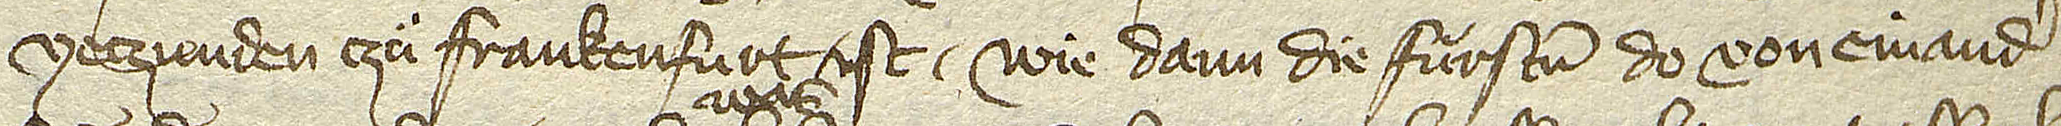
yecʒunden cʒü frankfurt iſt / wie dann die fürſtn* do von einand*
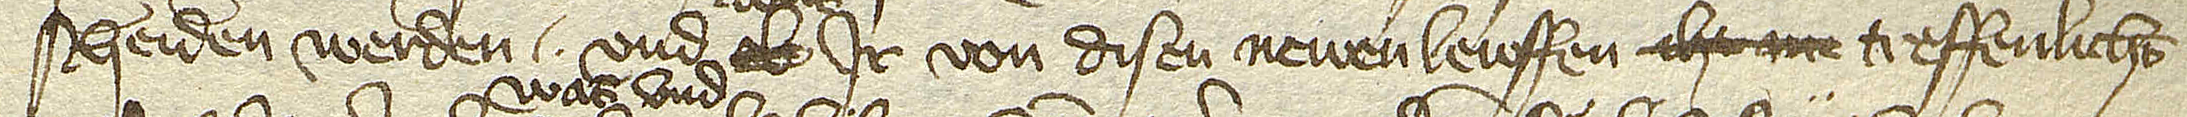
ſcheiden werden / . vnd ob Ir von diſen newen lewffen iht me treffenlichs
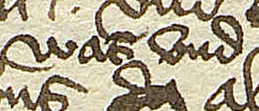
was vnd
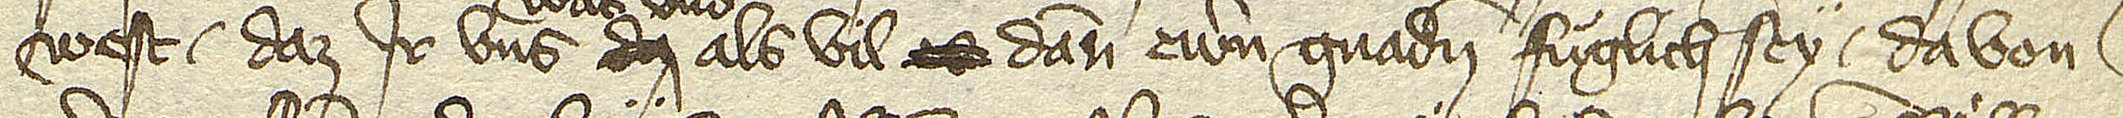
weſt / daʒ Ir vns da als vil es dan* ewn* gnadn* füglich ſey / davon
